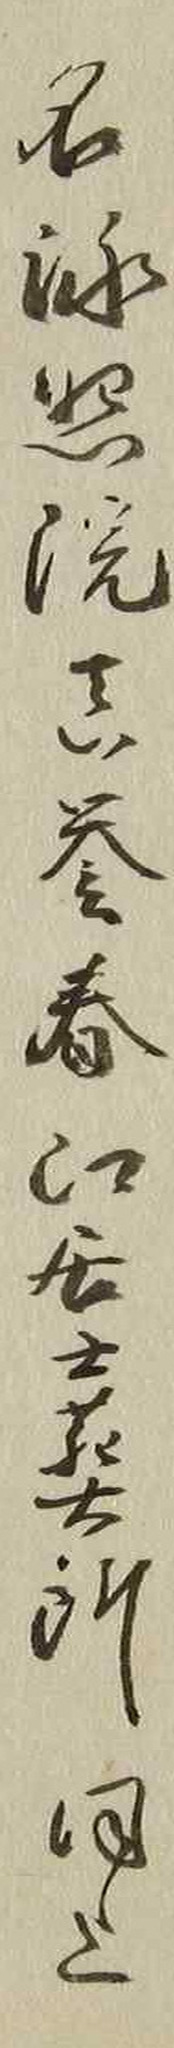名詠照院真誉春江居士葬所同上
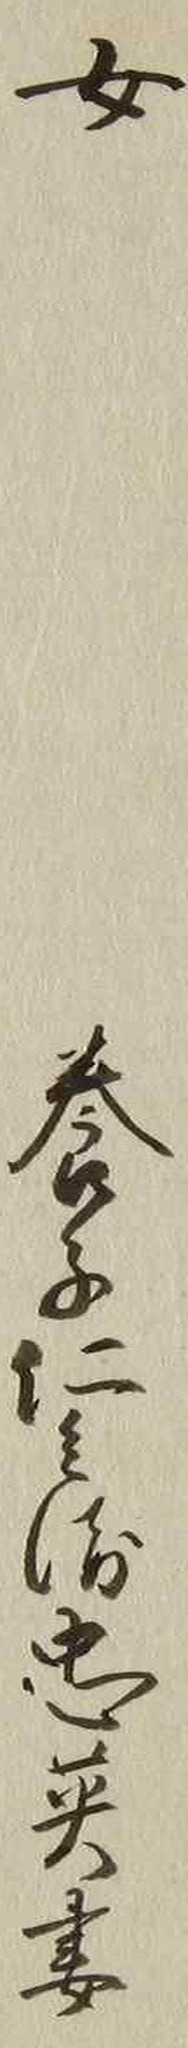女養子仁兵衛忠英妻
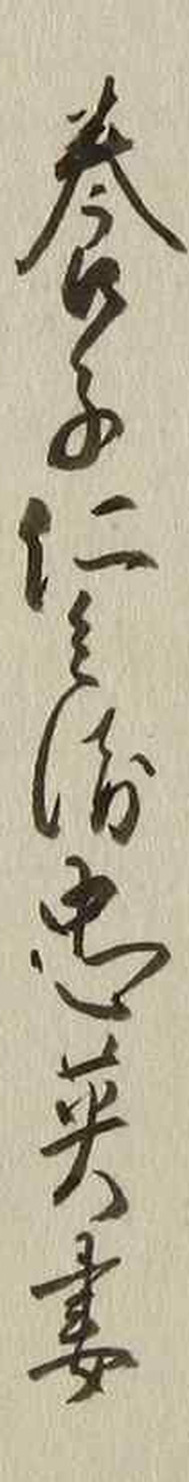女養子仁兵衛忠英妻
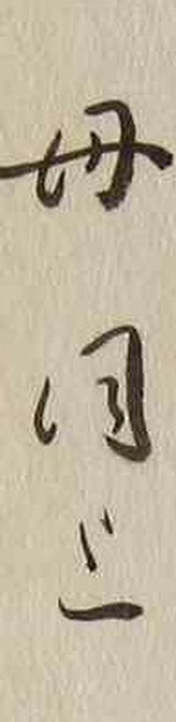母同上
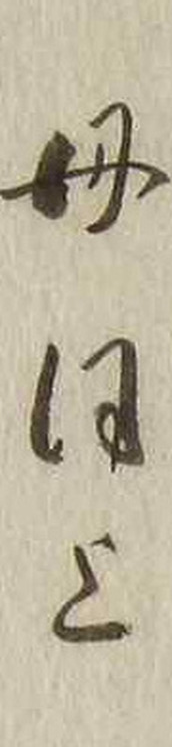母同上
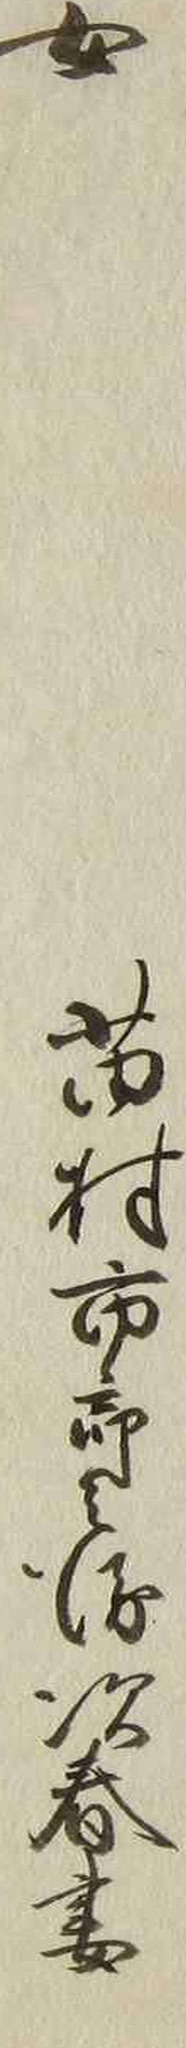女苗村市郎兵衛次春妻
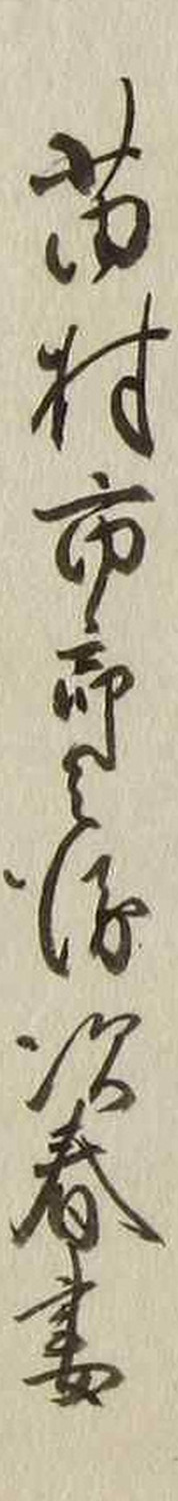女苗村市郎兵衛次春妻
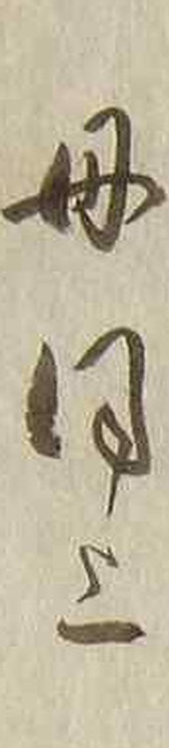母同上

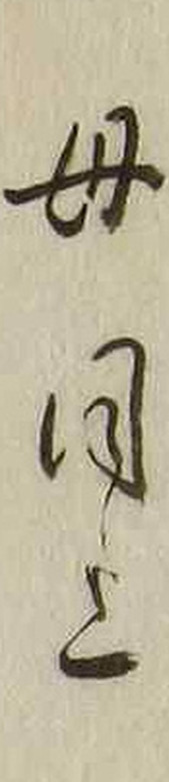母同上
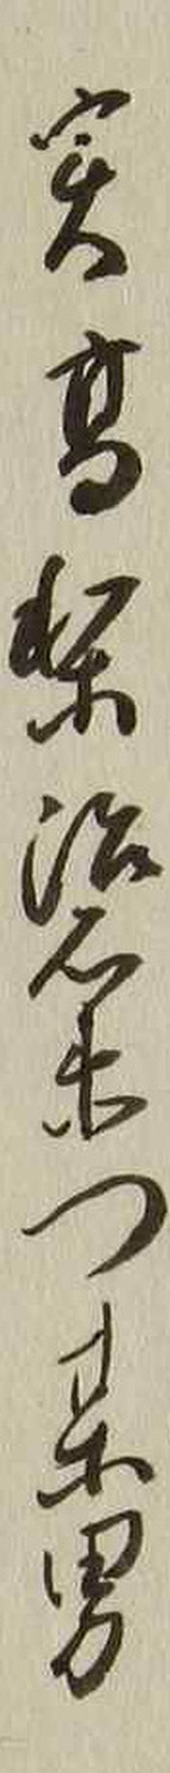実高梨治右衛門某男
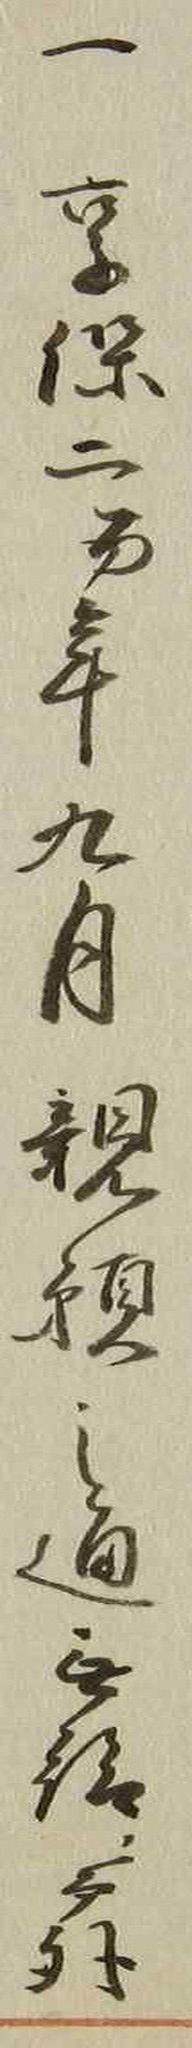一享保二酉年九月親願之通無給ニ而外
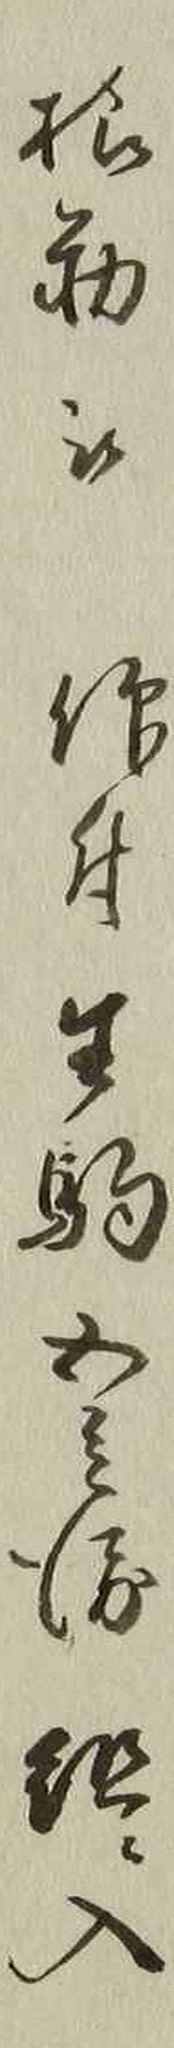様勤被仰付生駒五兵衛組ニ入
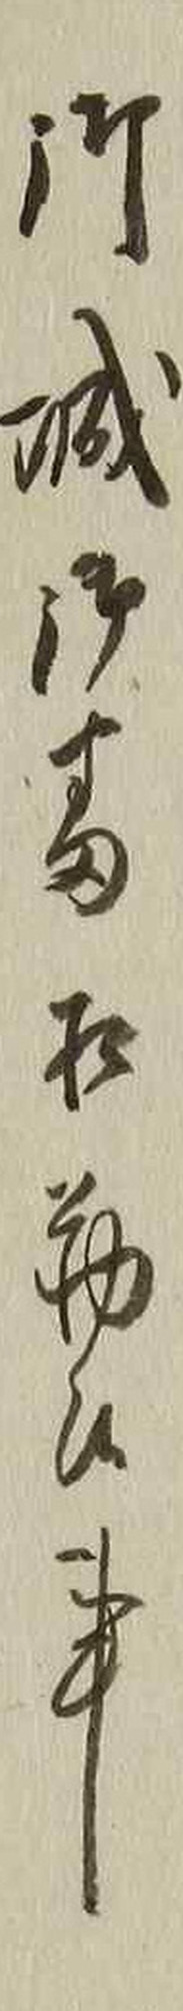御城御番相勤候事
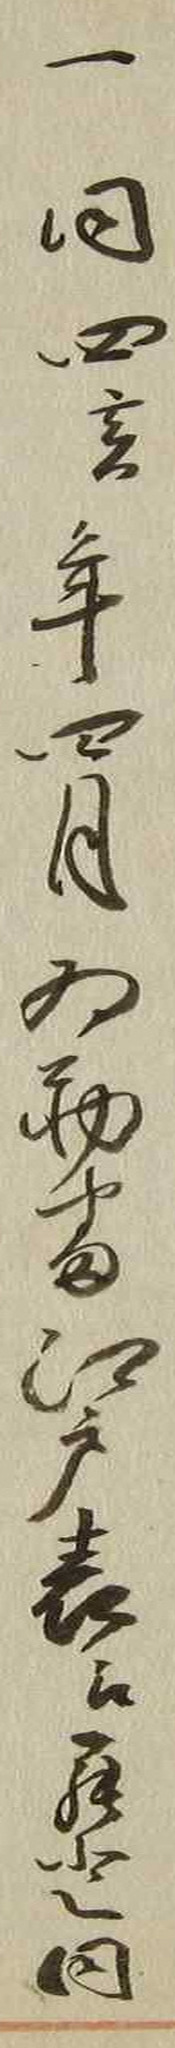一同四亥年四月為勤番江戸表江罷登同
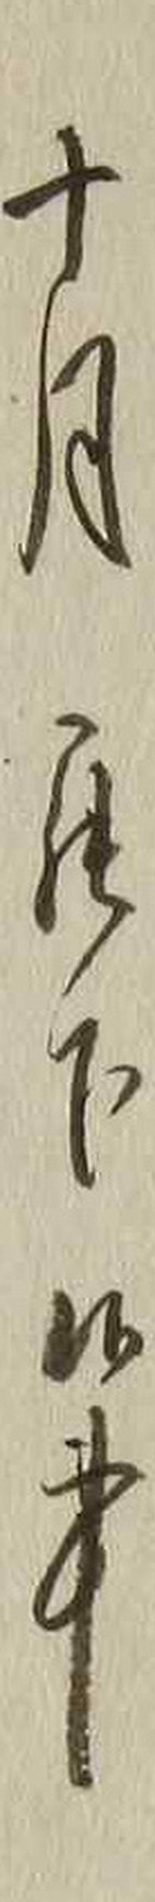十月罷下候事
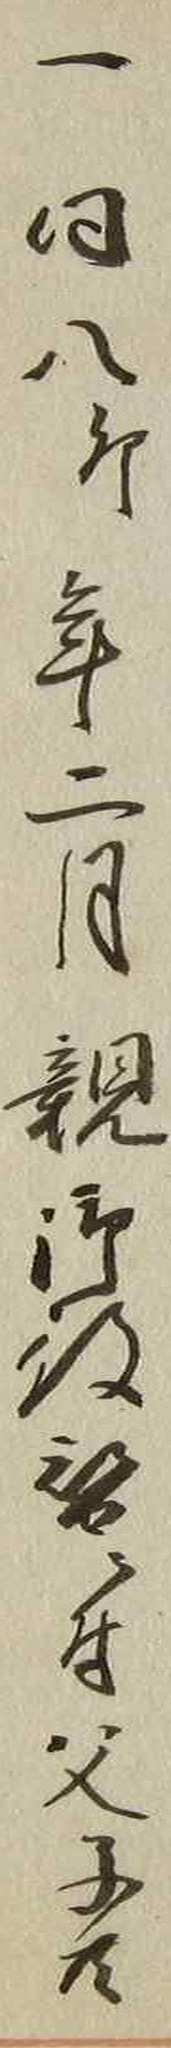一同八卯年二月親御役替ニ付父子共
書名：諸士系譜　巻之122　よ之部5
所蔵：会津若松市立会津図書館
